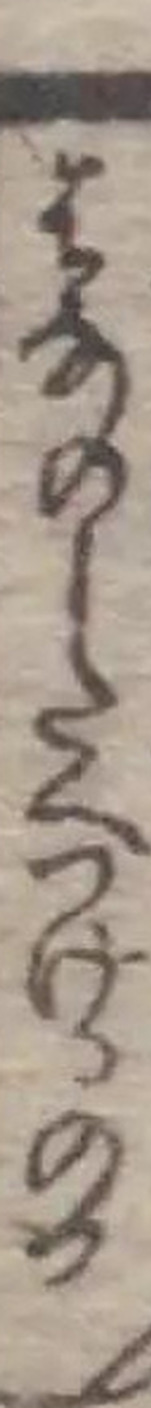はなのしたへつけるのか

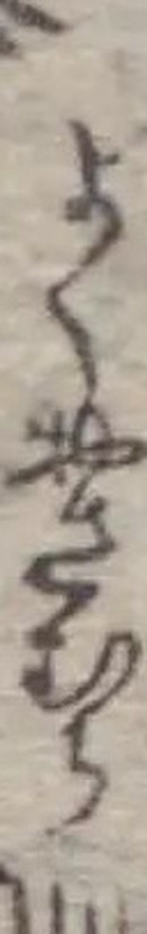よくおさむら
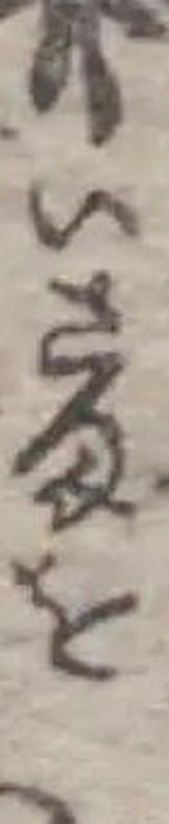いさまを
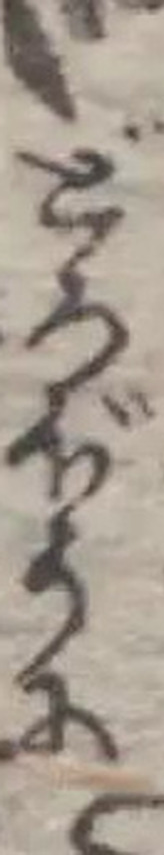どろぼうに
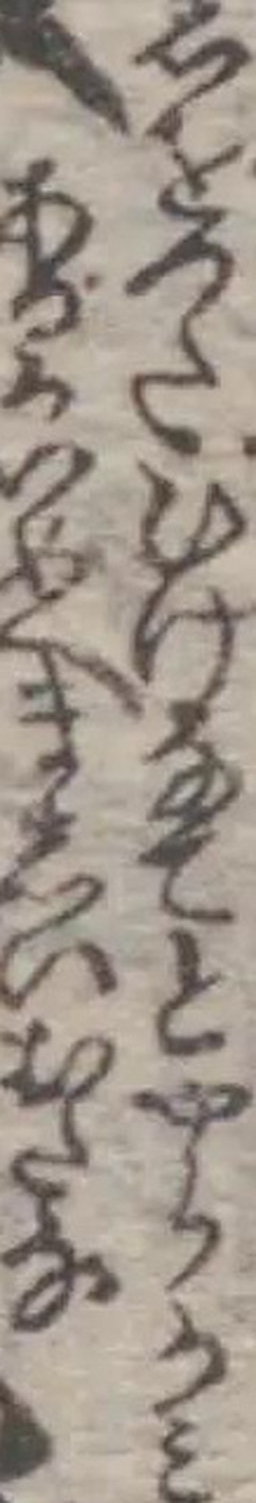あるかいめへましいむたな
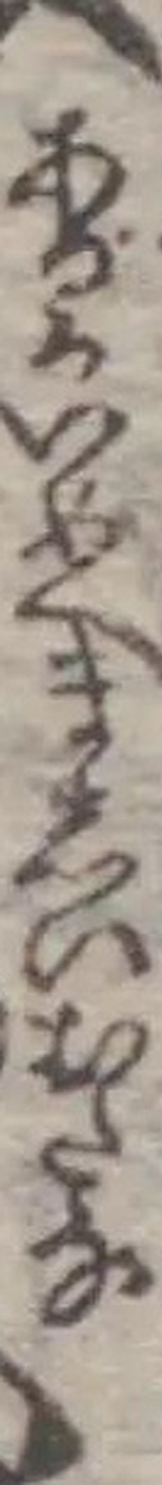あるかいめへましいむたな
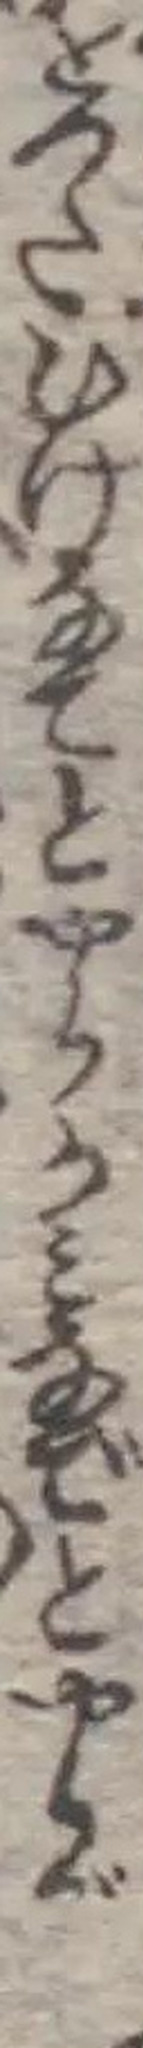しおつたひげなてとやらかみなでとやらが
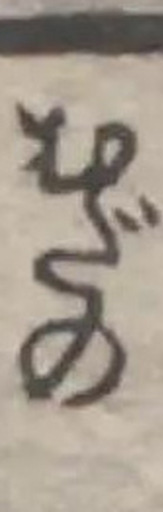むだの
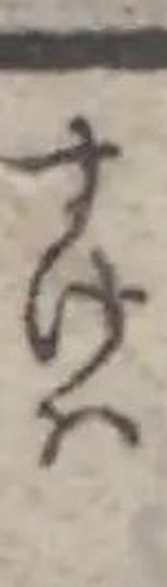すけは
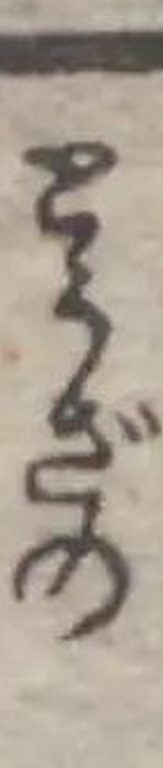とうざの
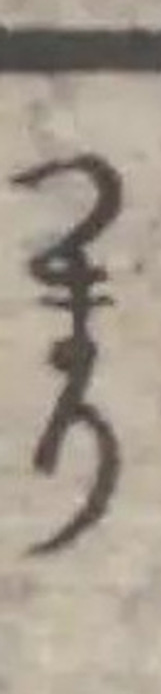つまり
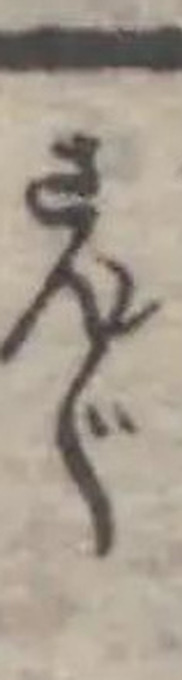さん〴〵
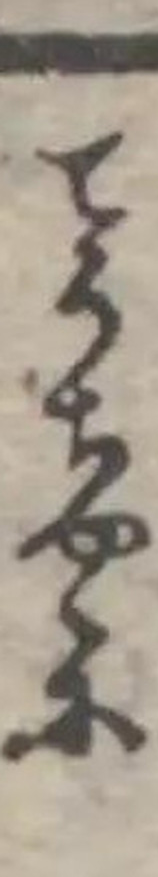てうちやくに
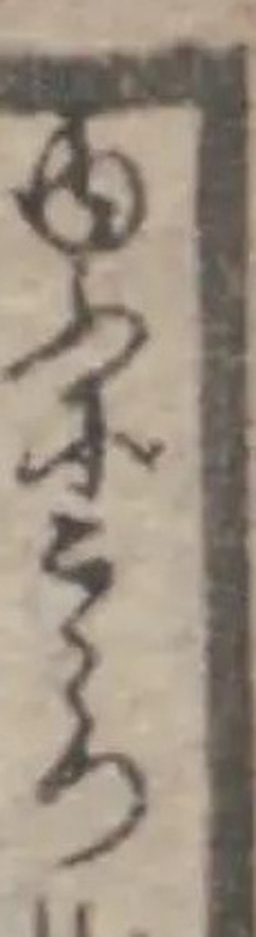ゆふにこゝろ
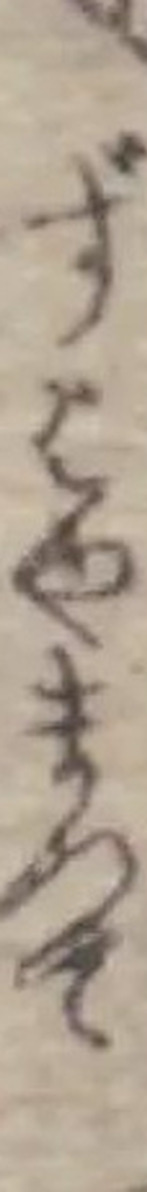ずはやまつて
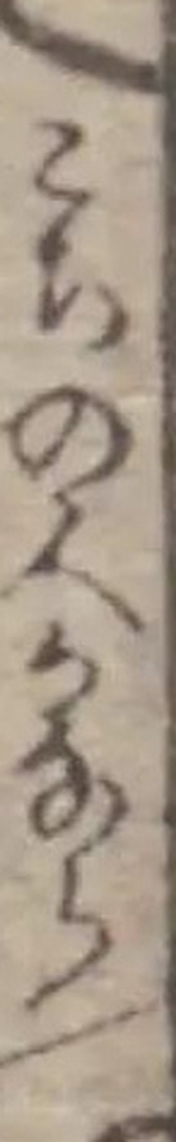こちの人かなら
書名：富多高慢噺 3巻
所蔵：国立国会図書館 National Diet Library, JAPAN
